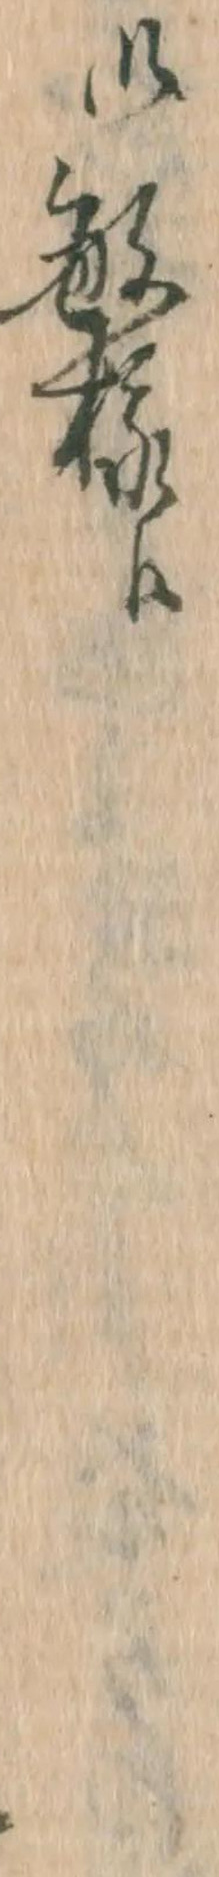御敏様え
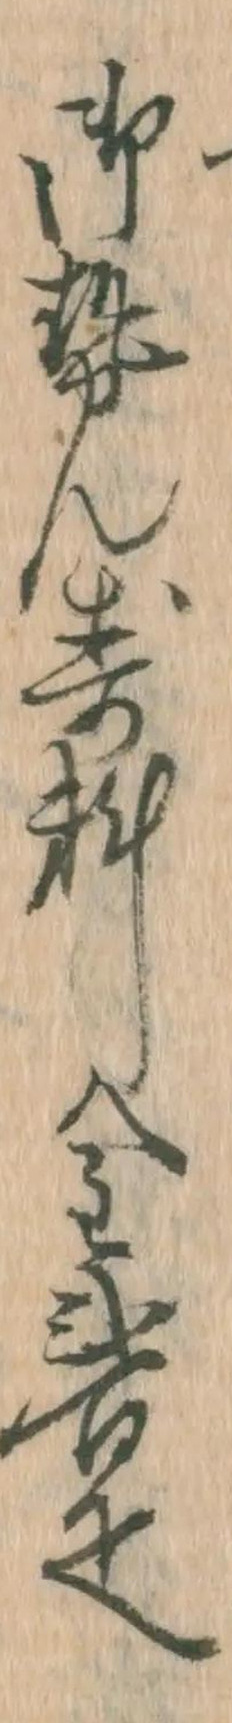御せんす料金弐百疋
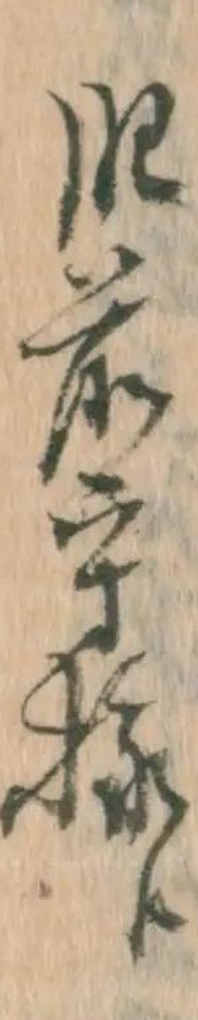肥前守様え
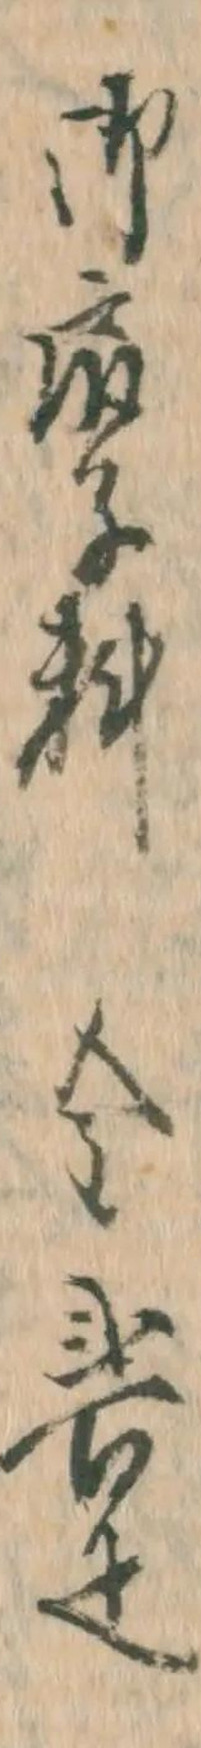御扇子料金弐百疋
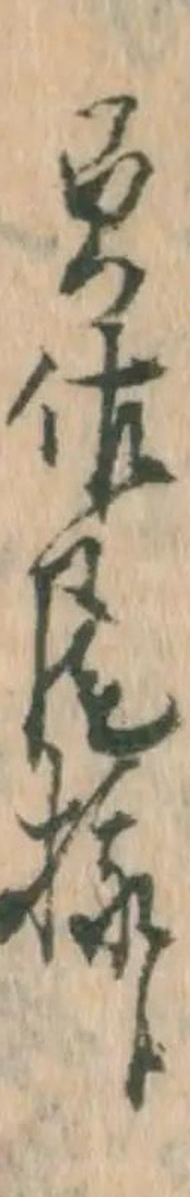美佐尾様え
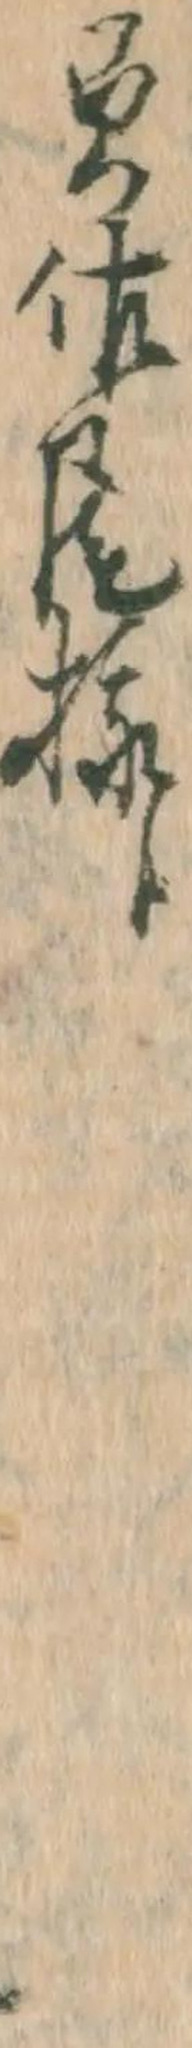美佐尾様え
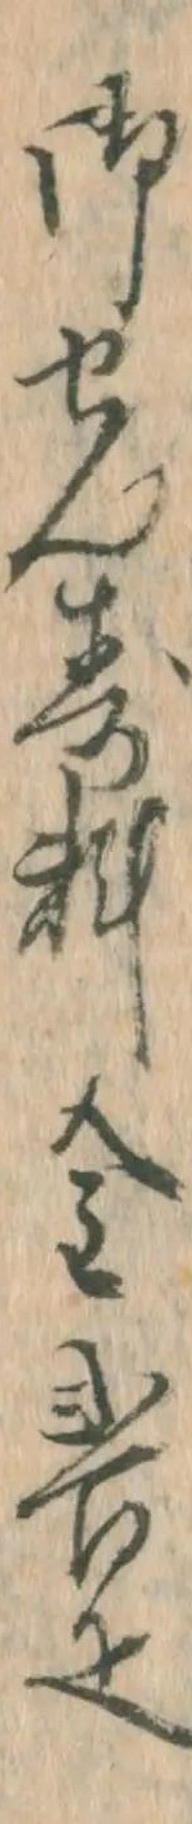御せんす料金弐百疋
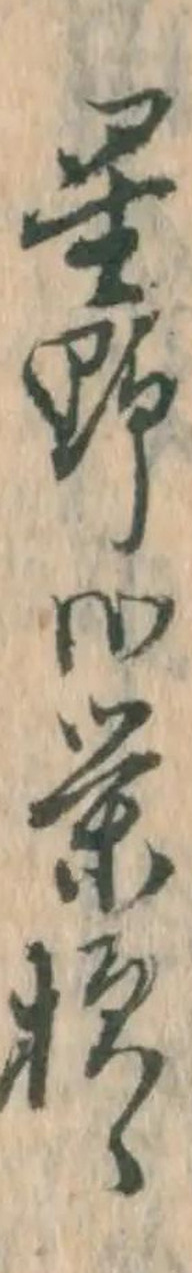星野御栄様へ
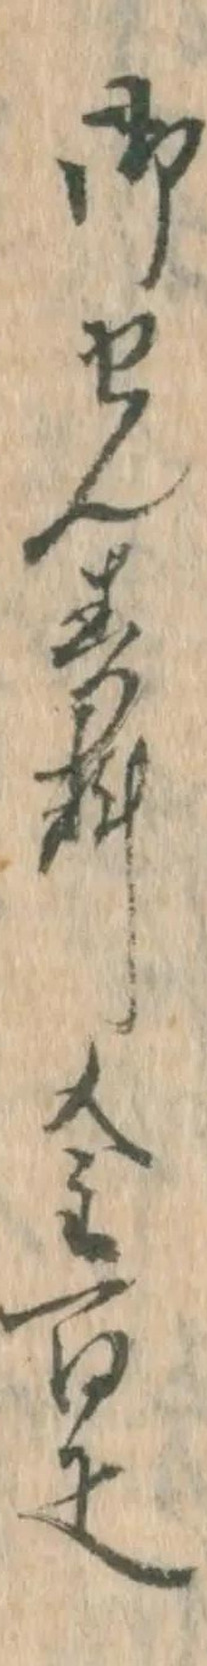御せん寿料金百疋
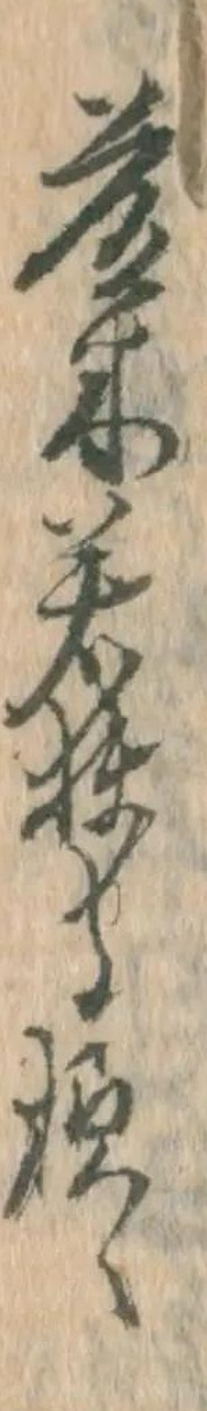藤木若狭守様へ
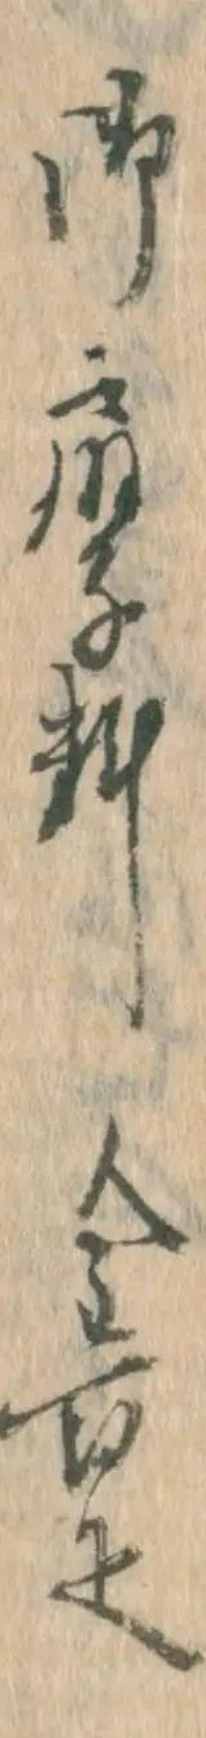御扇子料金百疋
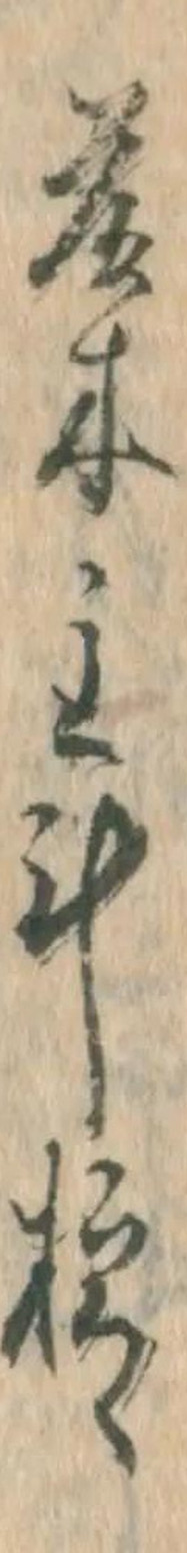藤木主斗様へ
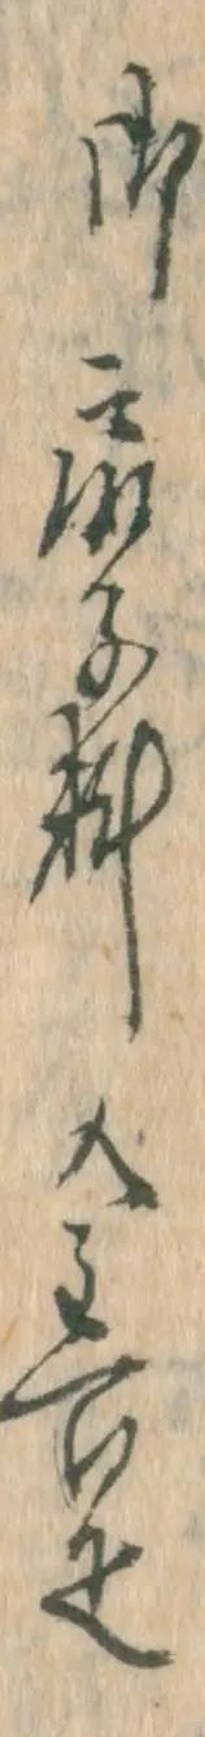御扇子料金百疋
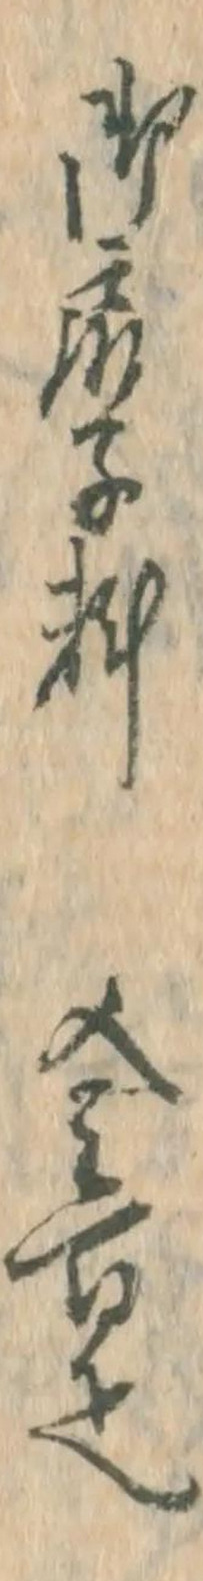御扇子料金百疋

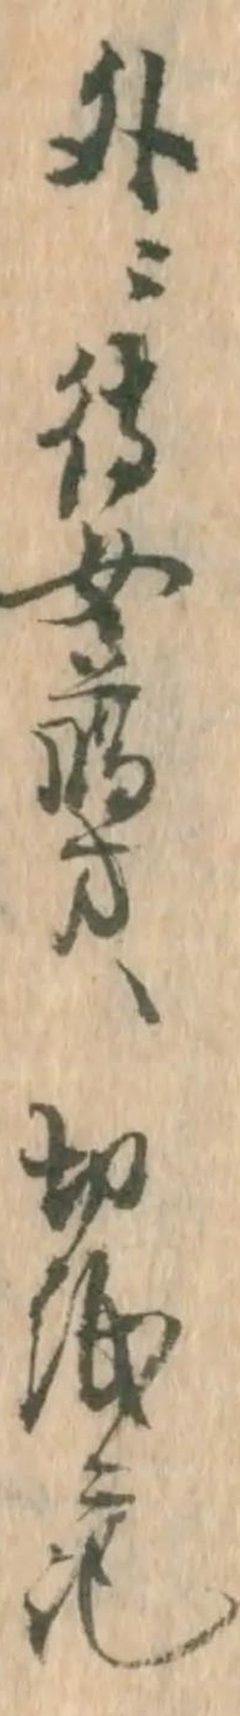外ニ侍女臈方へ切紙ニ記
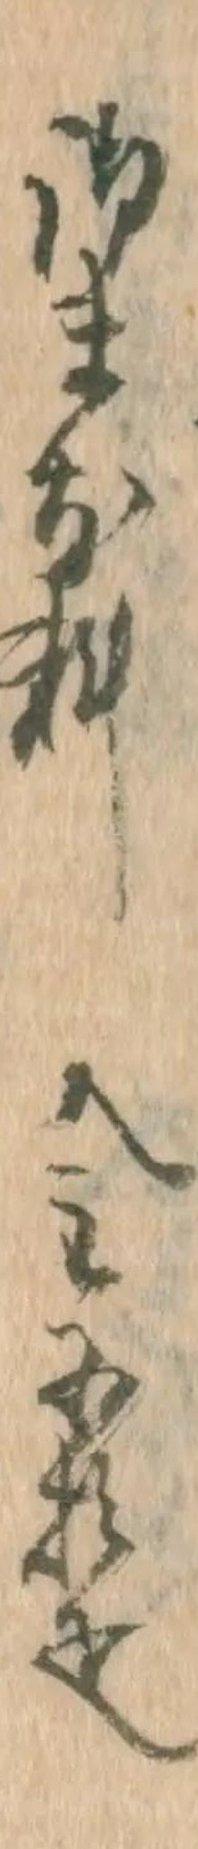御まな料金五拾疋
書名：賀茂社記録. 第69冊
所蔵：国立国会図書館 National Diet Library, JAPAN
